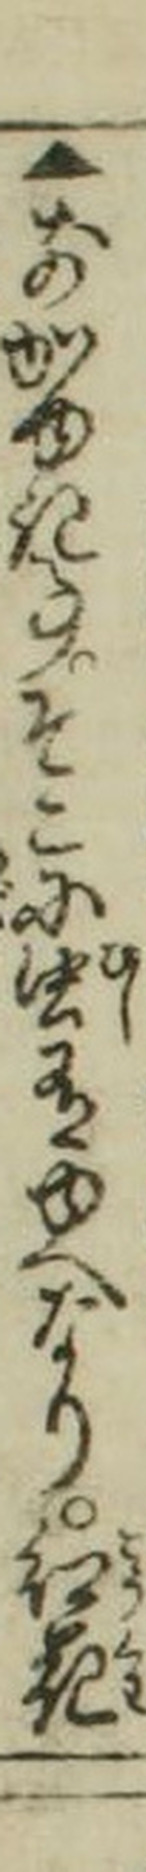▲前かゆき事。そこに虫有ゆへなり。紅花
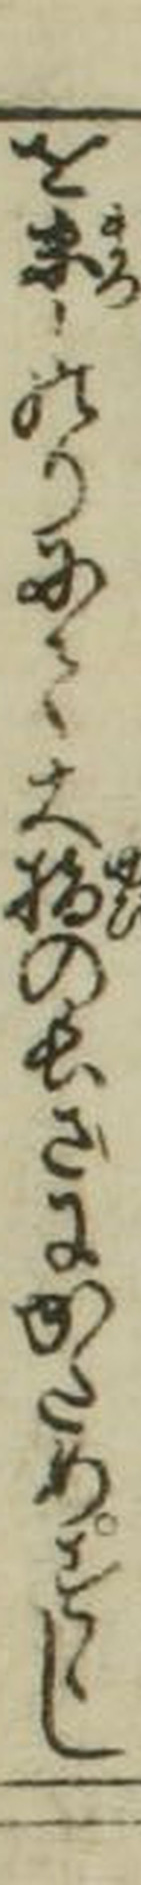を末しのりにて大指の長さにかため。すゝし
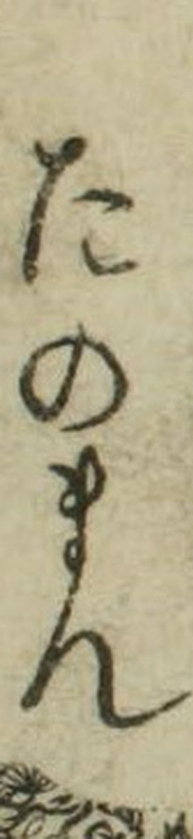たのまん
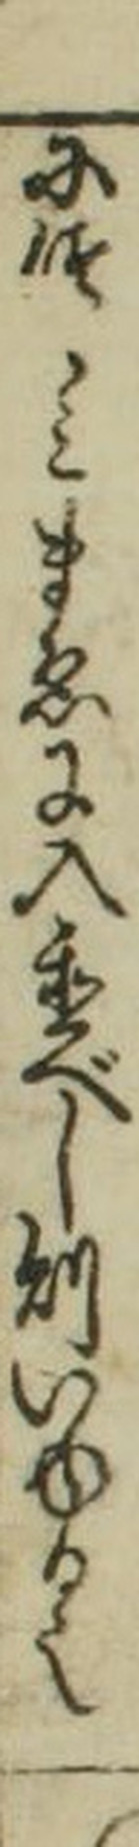につゝみまゑに入置べし則いゆる也

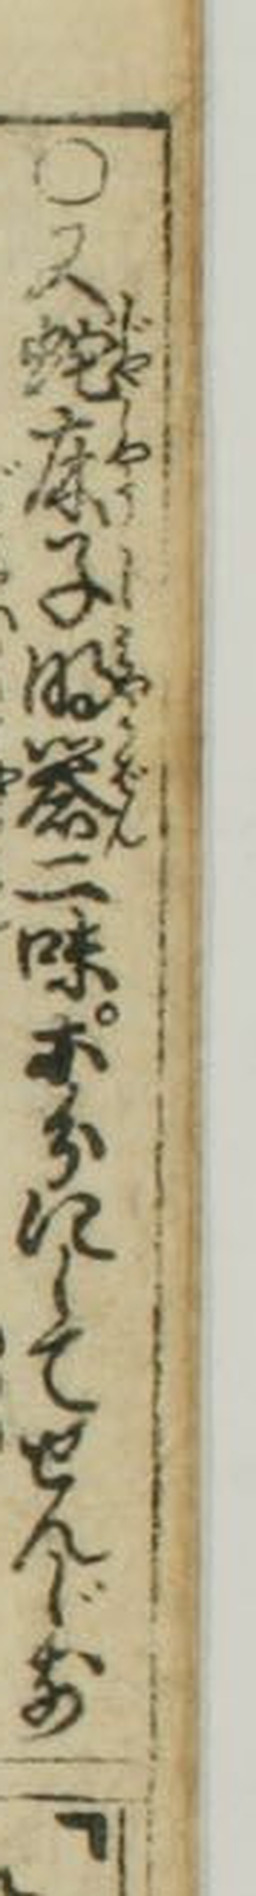◯又蛇床子明礬二味。等分にしてせんじ前
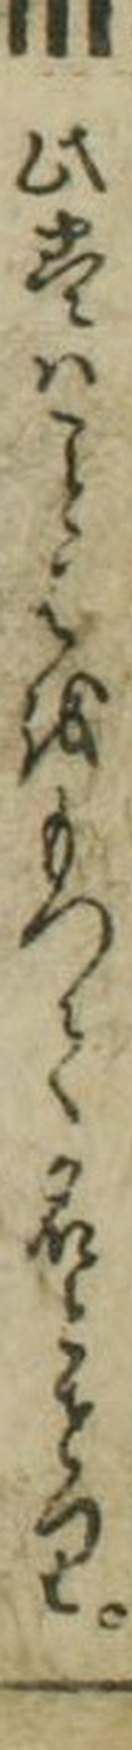此巻はことはをもつて名とせり。
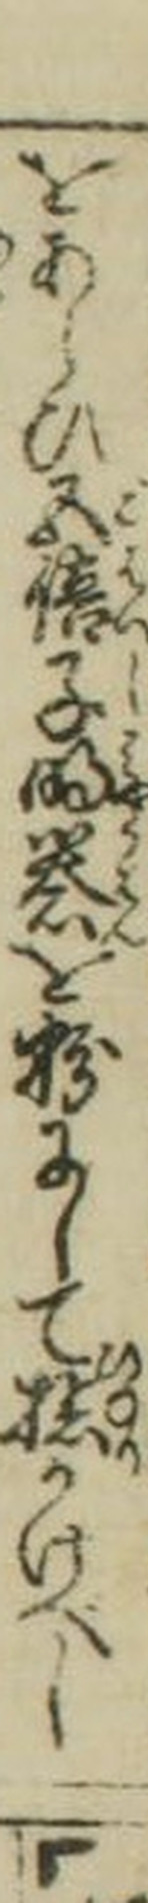をあらひ五倍子明礬を粉にして捻かけべし
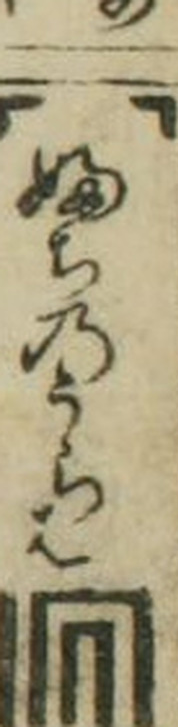「ふちのうらは
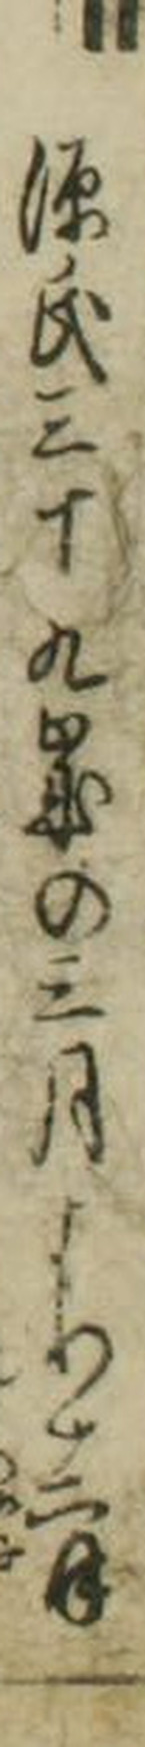源氏三十九歳の三月より十二月
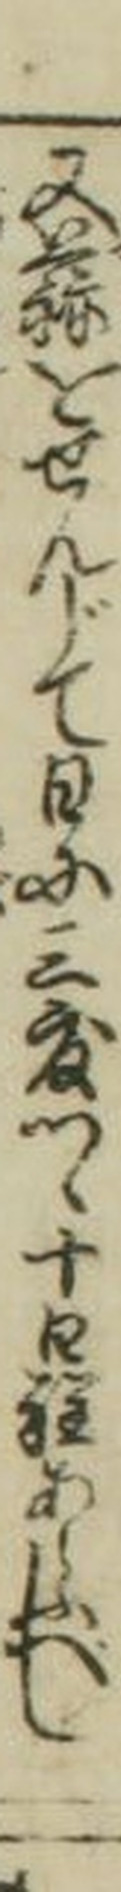又韮をせんじて日に三度つゝ十日程あらふべし
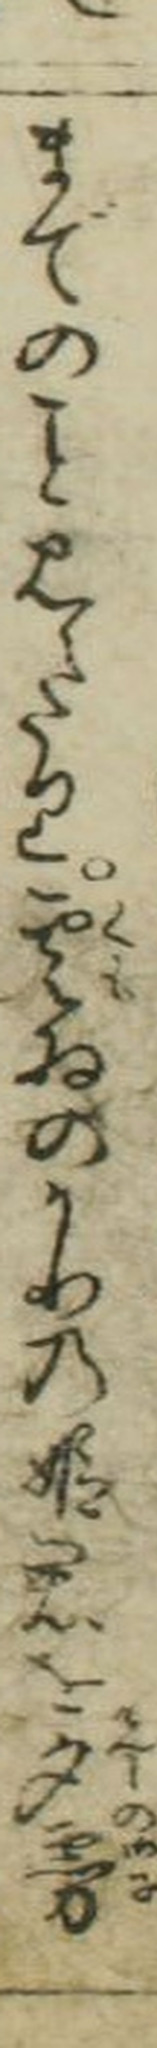までのこと見えたり。雲ゐのかりの姫君を夕霧
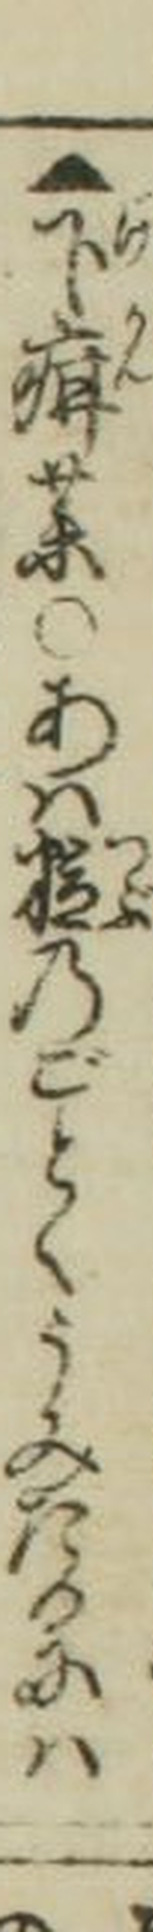▲下疳薬◯あは粒のごとくうみたるには
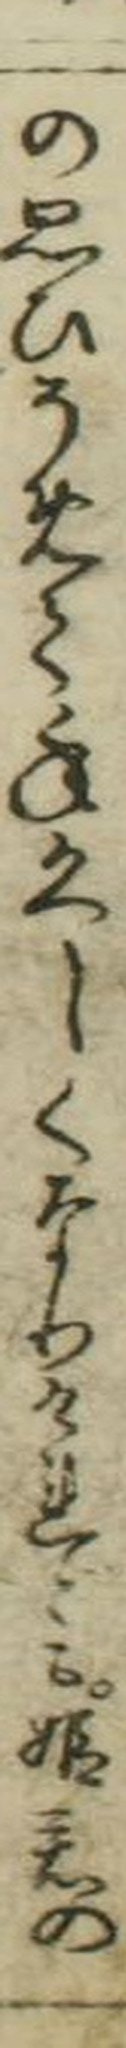の思ひそめて年久しくなりけれども。姫君の
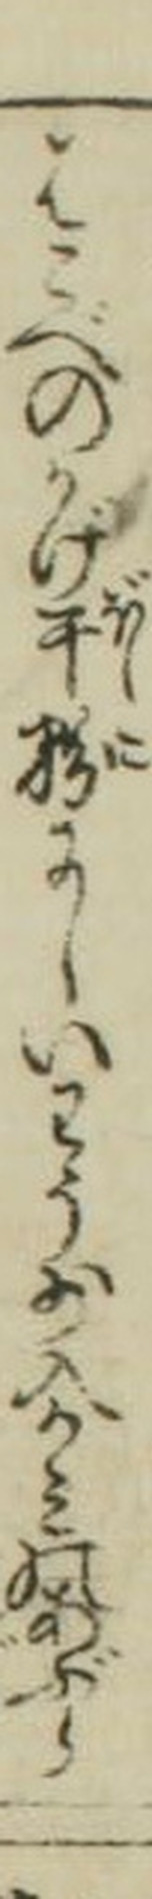はこべのかげ干粉にしいわう少入かみのあぶら
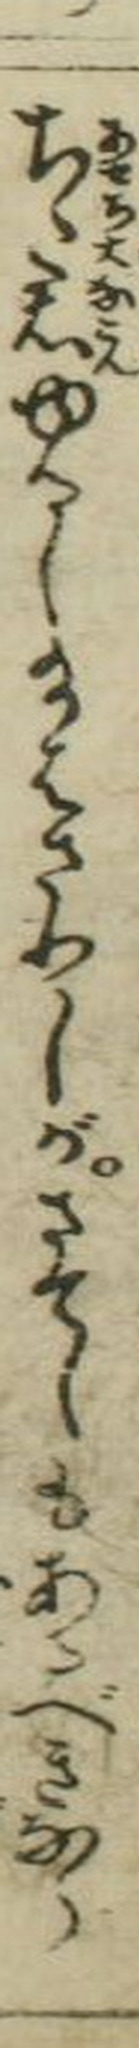ちゝ君ゆるし給はさりしが。さてしもあるべきなら
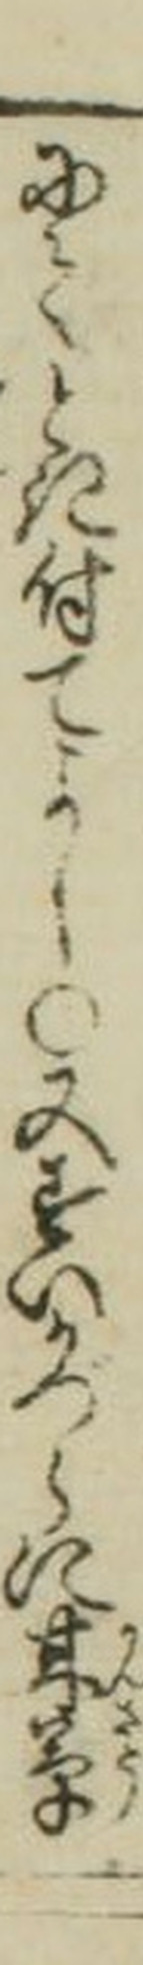にてとき付てよし◯又すいかづらに甘草
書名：女源氏教訓鑑
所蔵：東京学芸大学附属図書館
